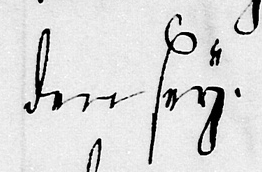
den sey.
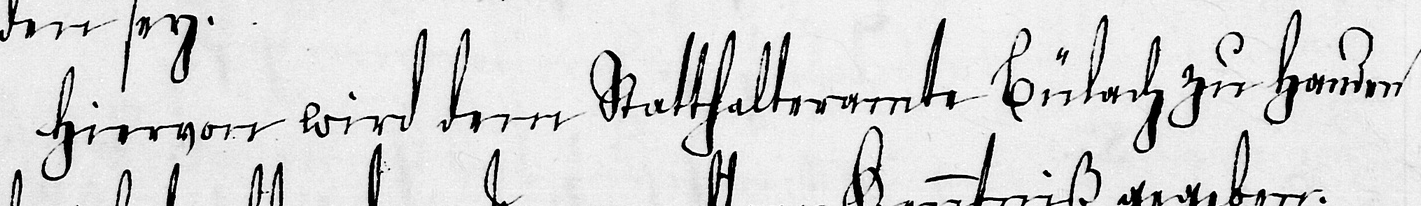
Hiervon wird dem Statthalteramte Bülach zu Handen
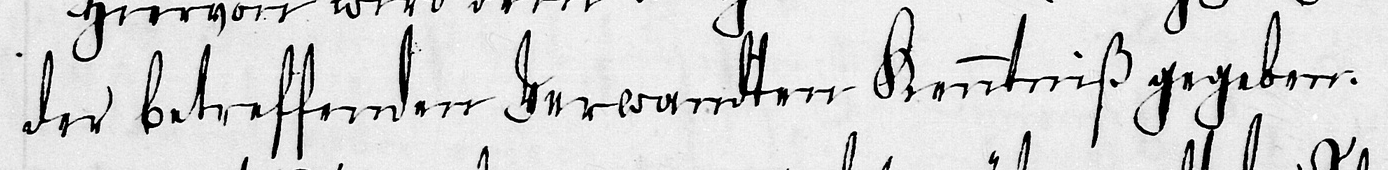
der betreffenden Verwandten Kenntniß gegeben.
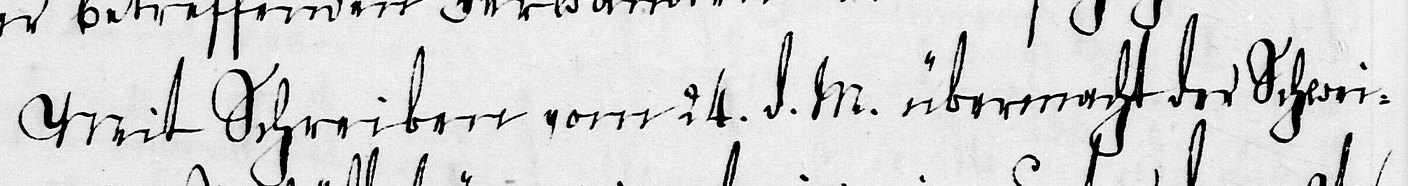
Mit Schreiben vom 24. d. M. übermacht der Schwei¬
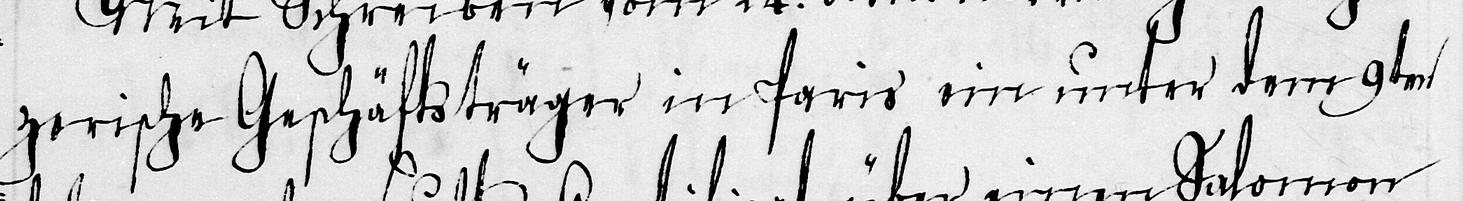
zerische Geschäftsträger in Paris ein unter dem 9ten
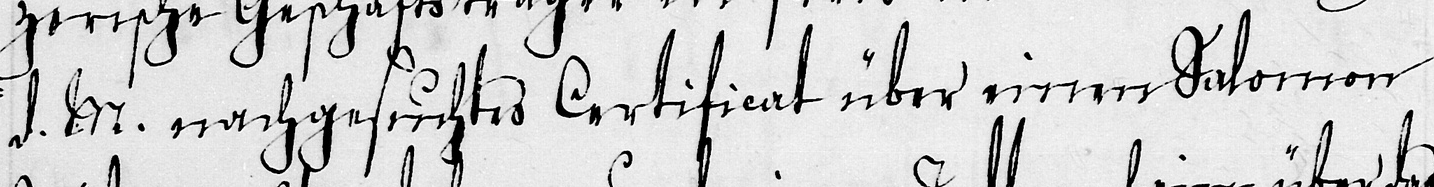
d. M. nachgesuchtes Certificat über einen Salomon
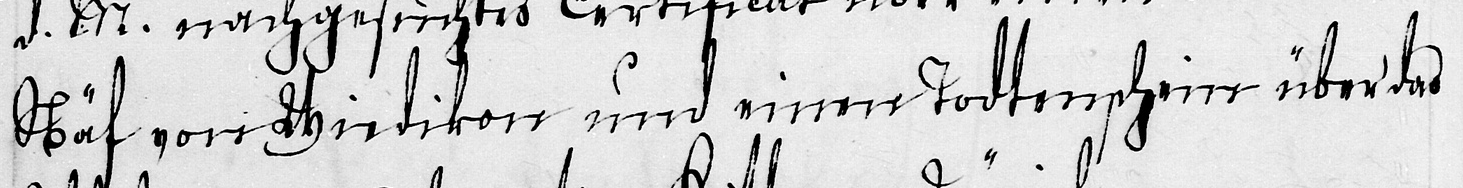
Näf von Wiedikon und einen Todtenschein über das
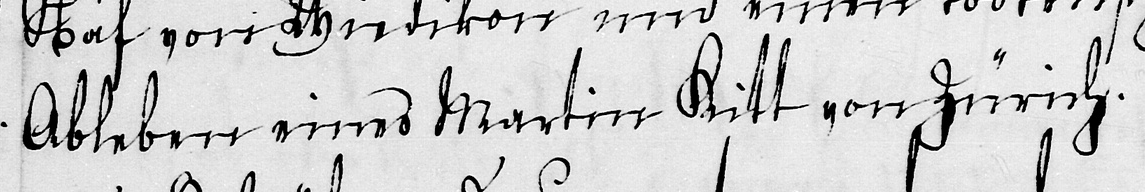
Ableben eines Martin Kitt von Zürich.
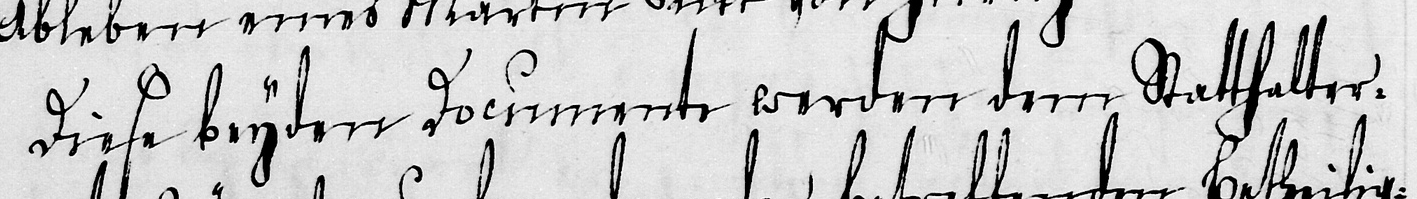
Diese beyden Documente werden dem Statthalter¬
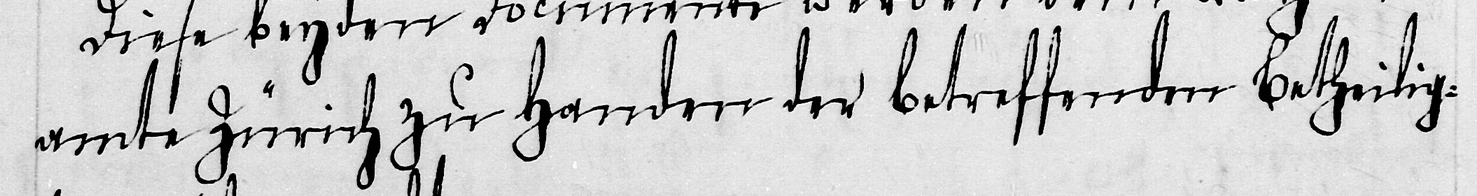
amte Zürich zu Handen der betreffenden Betheilig¬
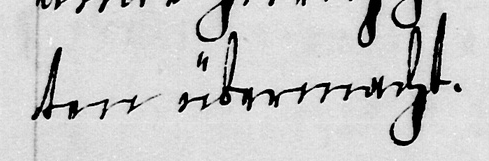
ten übermacht.
